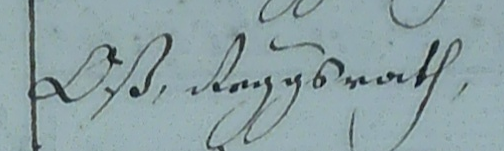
Oß, Reg͞gsrath,
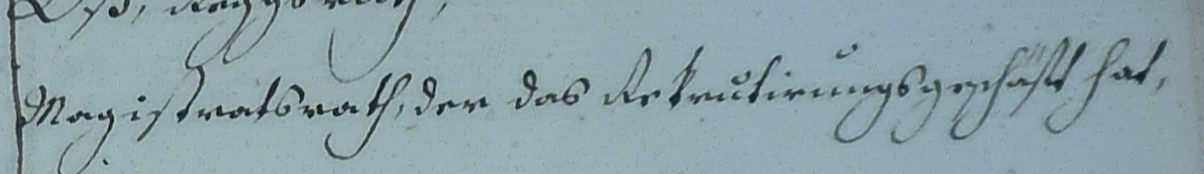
Magistratsrath, der das Rekrutirungsgeschäft hat,
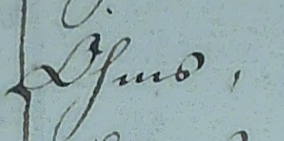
Ohms,
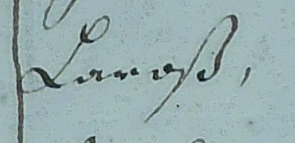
Laroß,
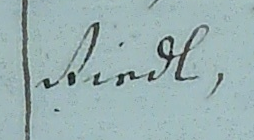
Riedl,
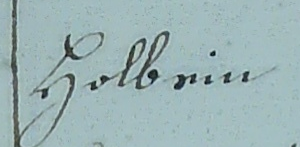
Holbein
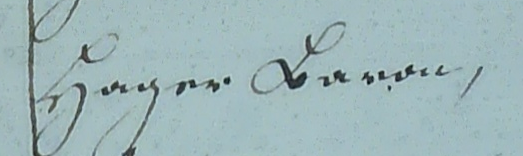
Hager Baron,
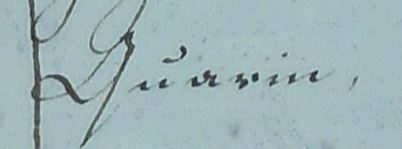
Quarin,
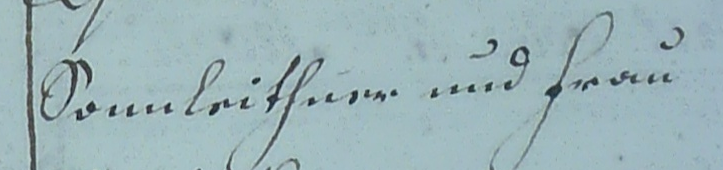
Sonnleithner und Frau
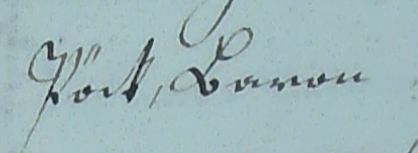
Pöck, Baron
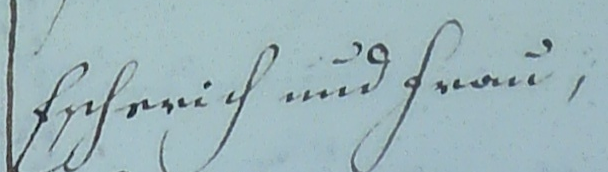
Escherich und Frau,
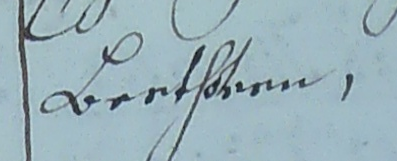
Beethoven,
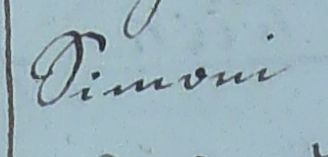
Simoni
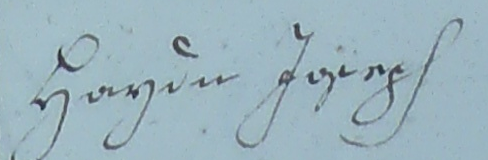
Haydn Joseph
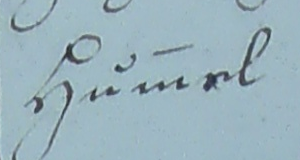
Hum̅el
